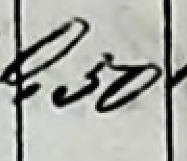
0,50
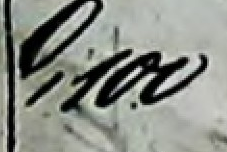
0,100
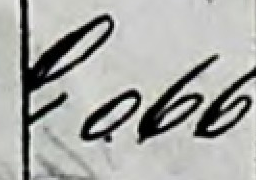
0,066
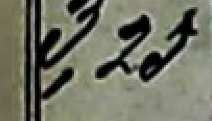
3,25
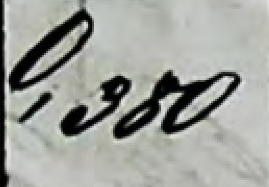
0,380
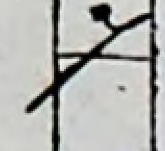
7
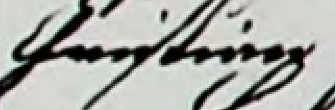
Christian
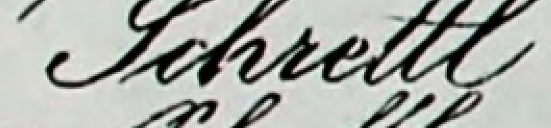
Schrettl
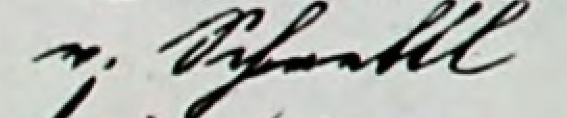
v. Schnettl
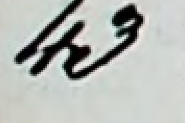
42
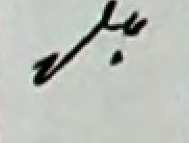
Do
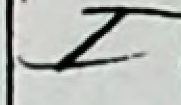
I
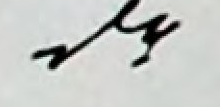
Do
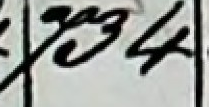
734
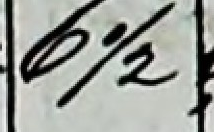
6 1/2
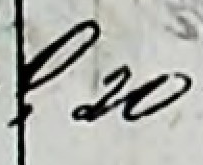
0,20
